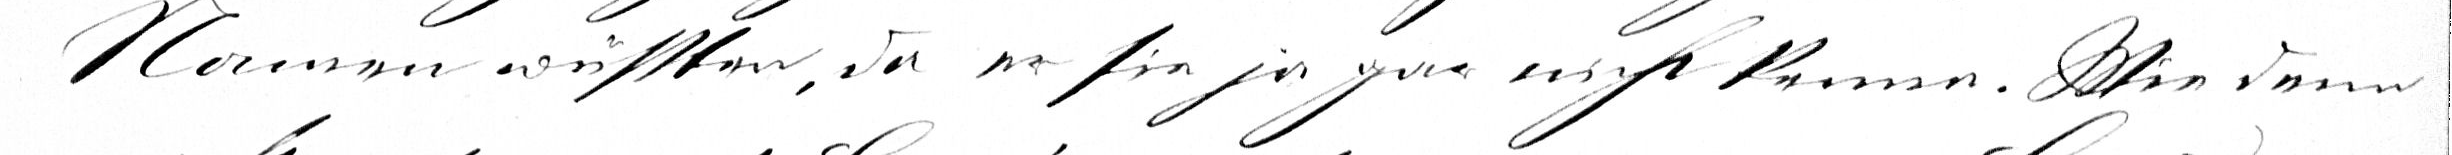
Namen wüßten, da er sie ja gar nicht kenne. Wie denn
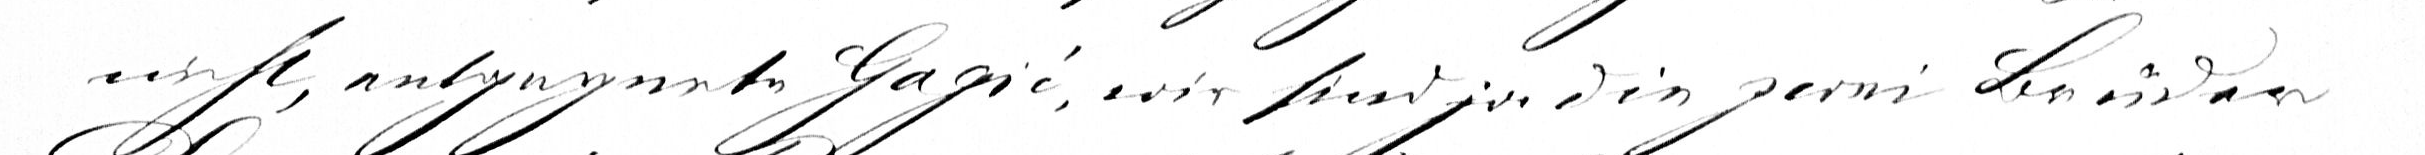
nicht, entgegnete Gagić, wir sind ja die zwei Brüder
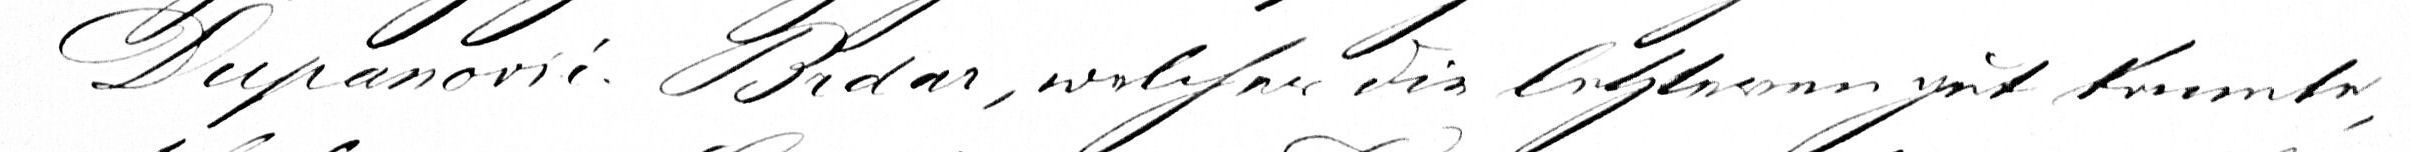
Dupanović. Brdar, welcher die letzteren gut kannte,
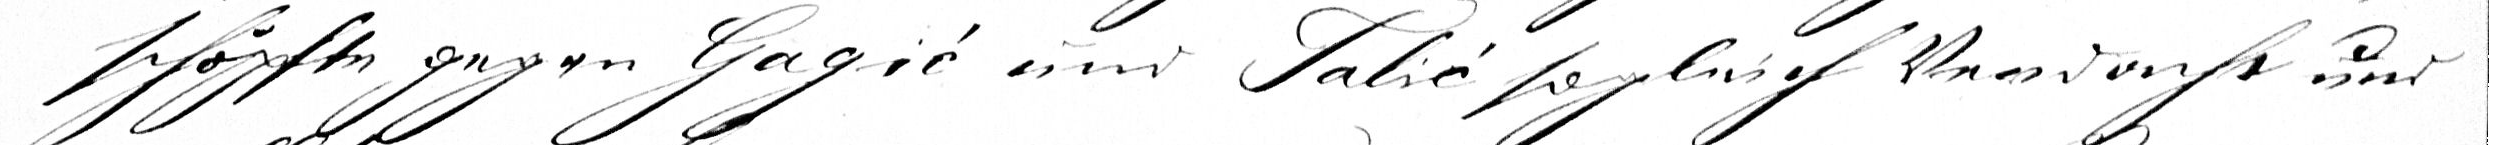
schöpfte gegen Gagić und Talić sogleich Verdacht und
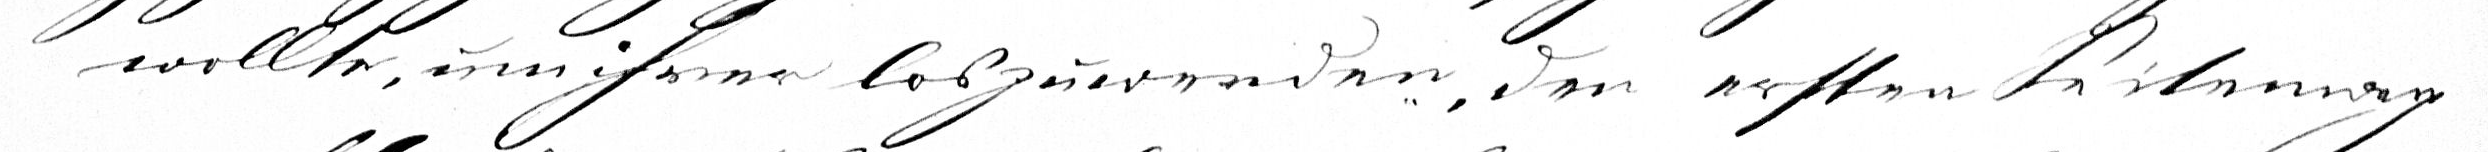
wollte, um ihrer loszuwerden, den ersten Seitenweg
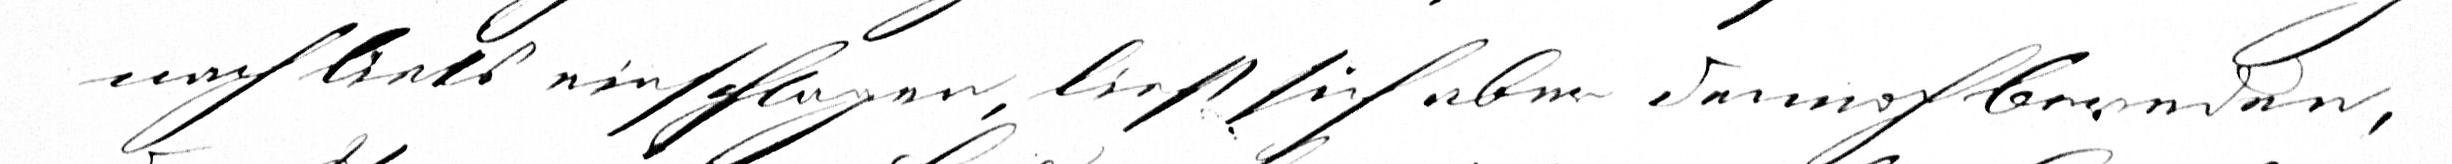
nachlxx einschlagen, ließ sich aber dennoch bereden,
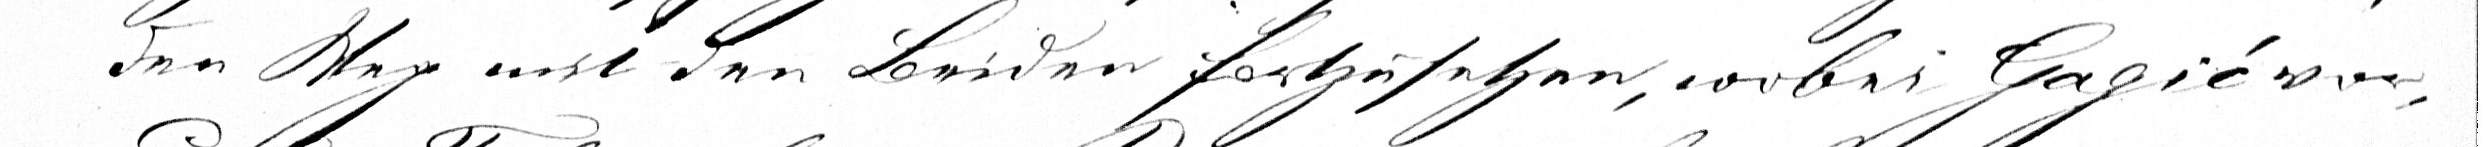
den Weg mit den Beiden Fortzusetzen, wobei Gagić vor,
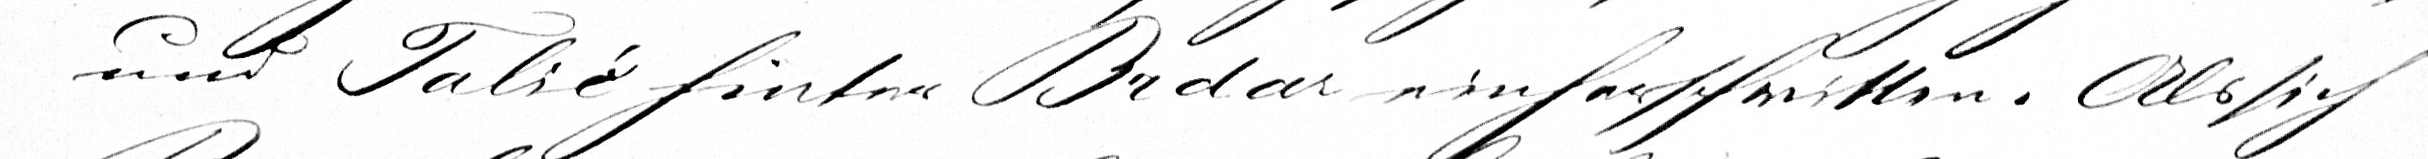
und Talić hinter Brdar einxxschritten. Als sich
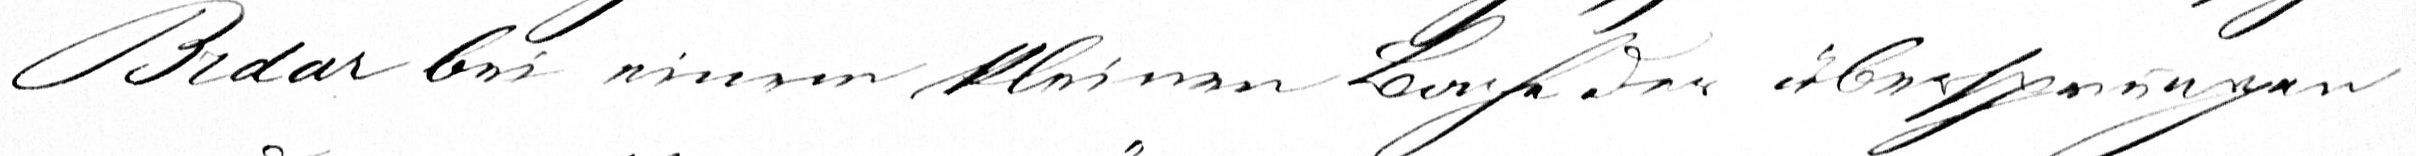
Brdar bei einem kleinen Bache der übersprungen
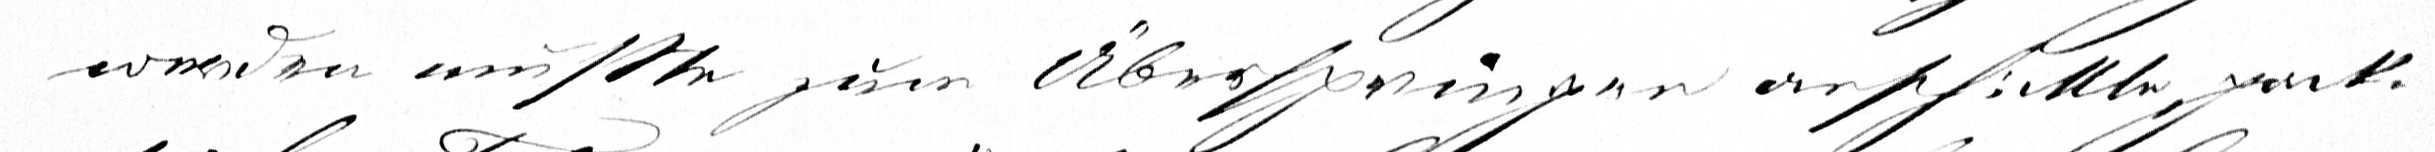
werden mußte zum Überspringen anschickte, pack¬
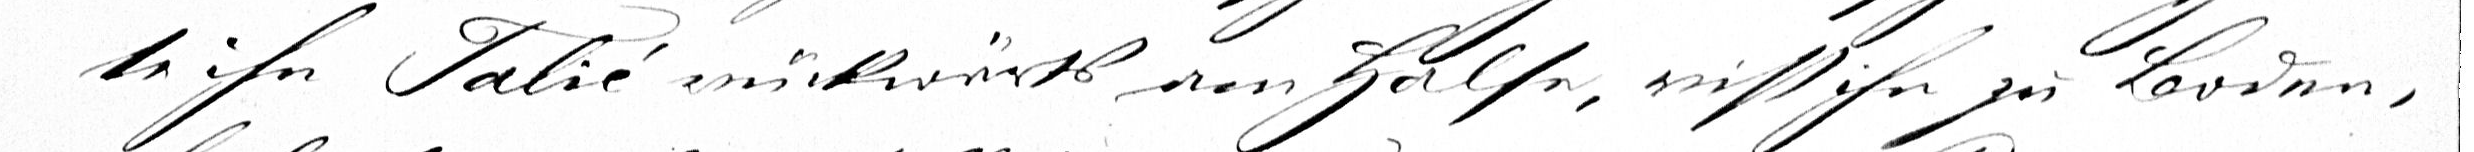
te ihn Talić rückwärts am Halse, riß ihn zu Boden,
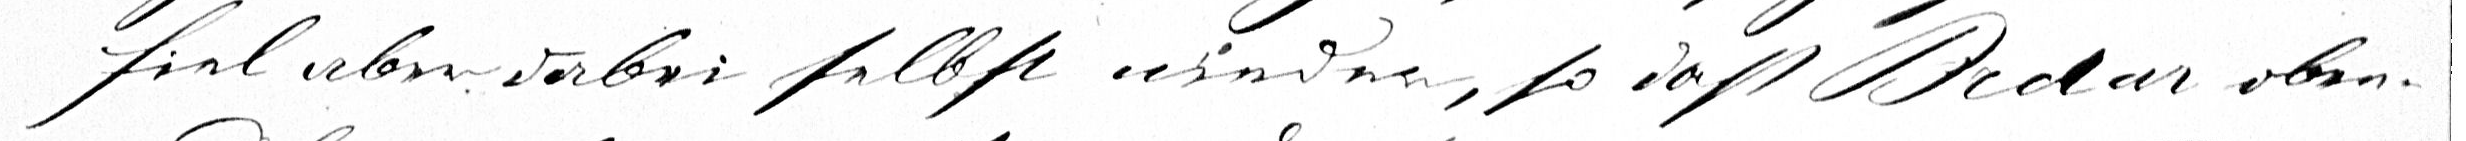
fiel aber dabei selbst wieder, so daß Brdar oben¬
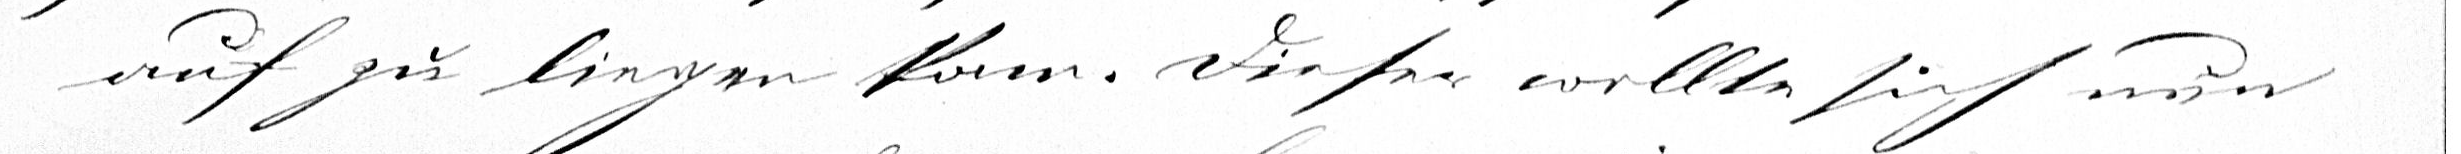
auf zu liegen kam. Dieser wollte sich nun
